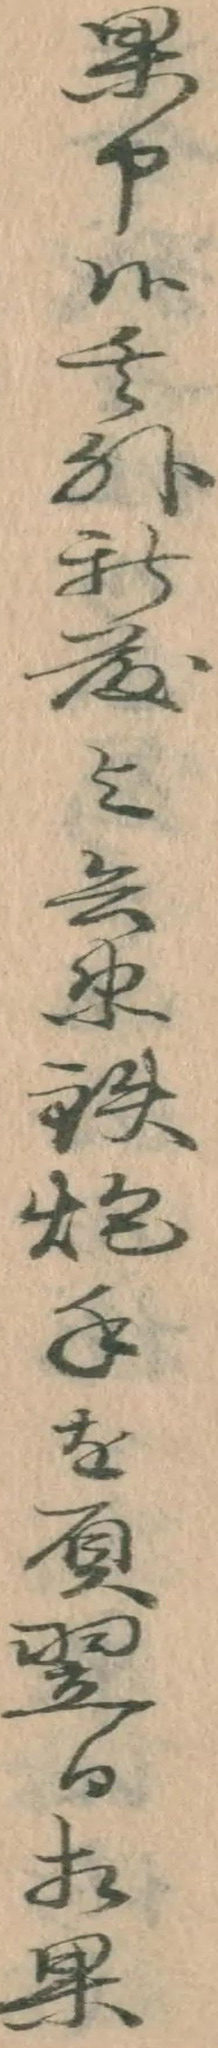果申候其外新藤与兵衛鉄炮手を負翌日相果
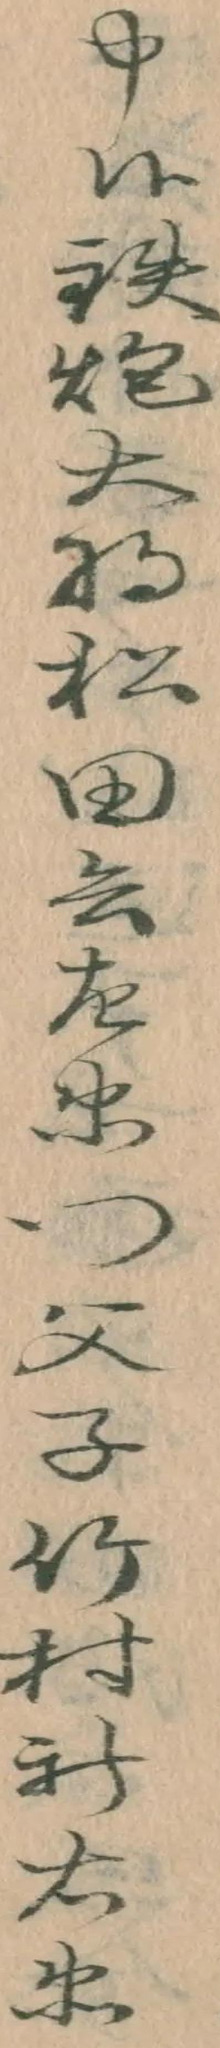申候鉄炮大将松田兵左衛門父子竹村新右衛
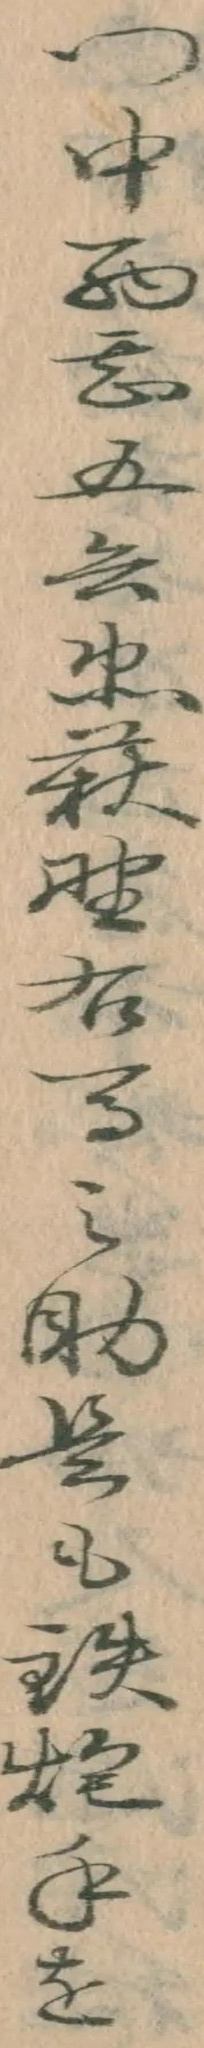門中西甚五兵衛萩野有馬之助是も鉄炮手を
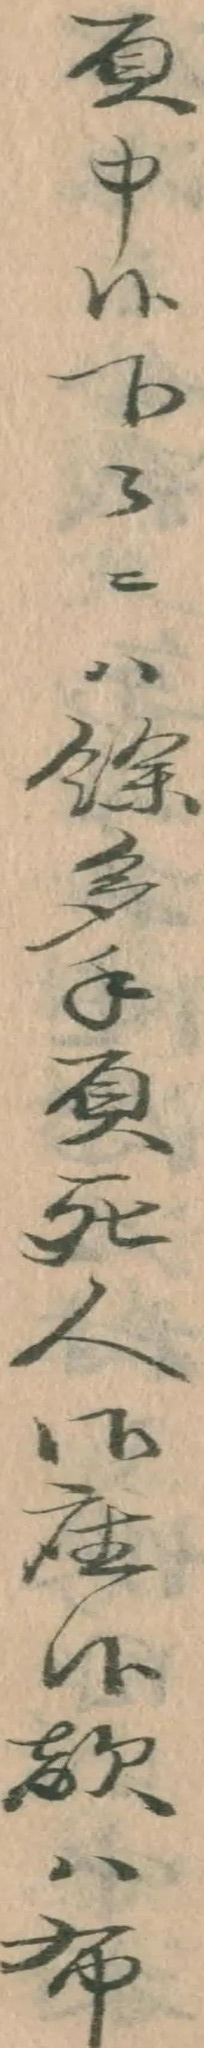負申候下々には余多手負死人御座候敵は布
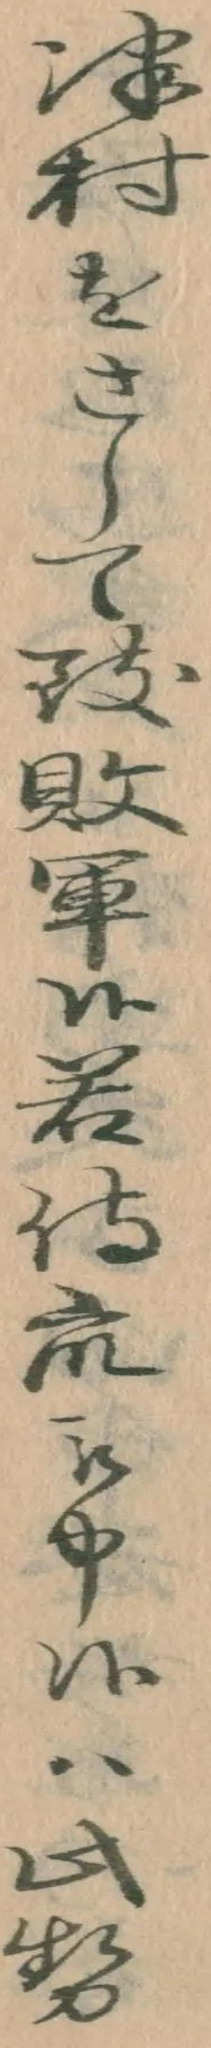津村をさして致敗軍候若侍衆被申候は此勢
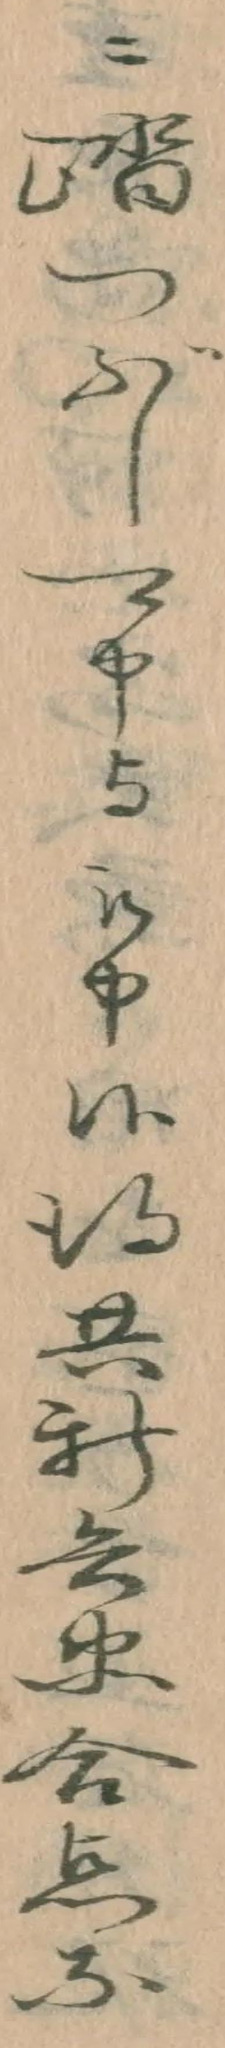に踏つぶし可申与被申候得共新兵衛合点な
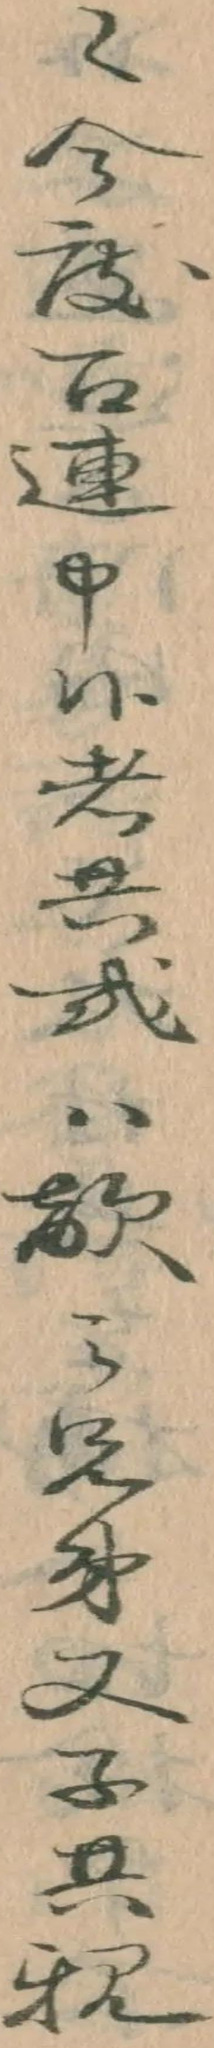く今度召連申候者共或は敵之兄弟又子共親
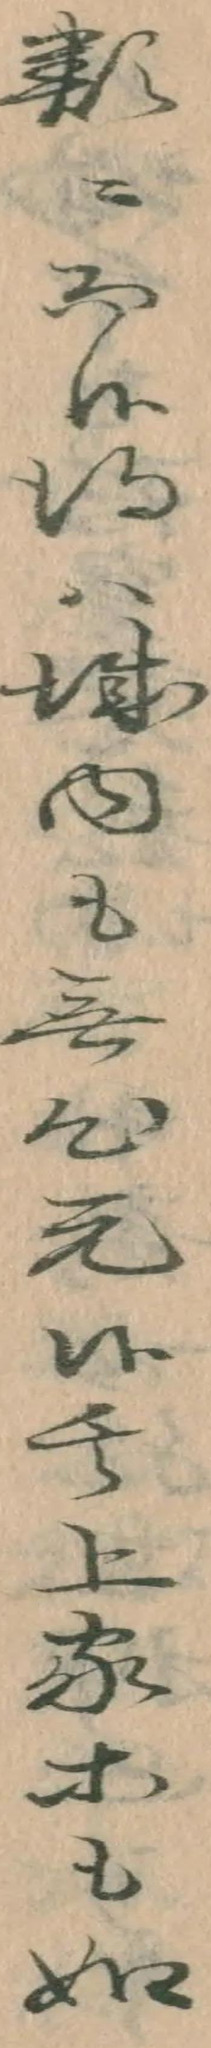類に而候得は城内も無心元候其上家等も如
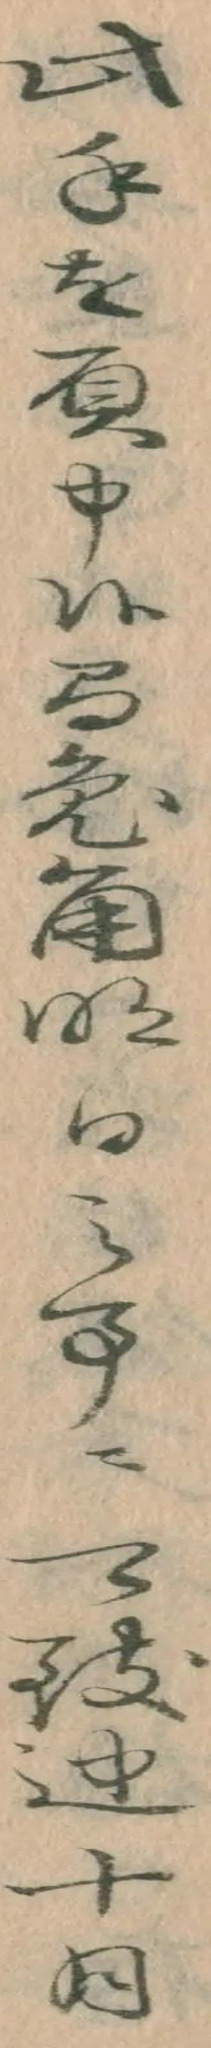此手を負申候間兎角明日之事に可致迚十月
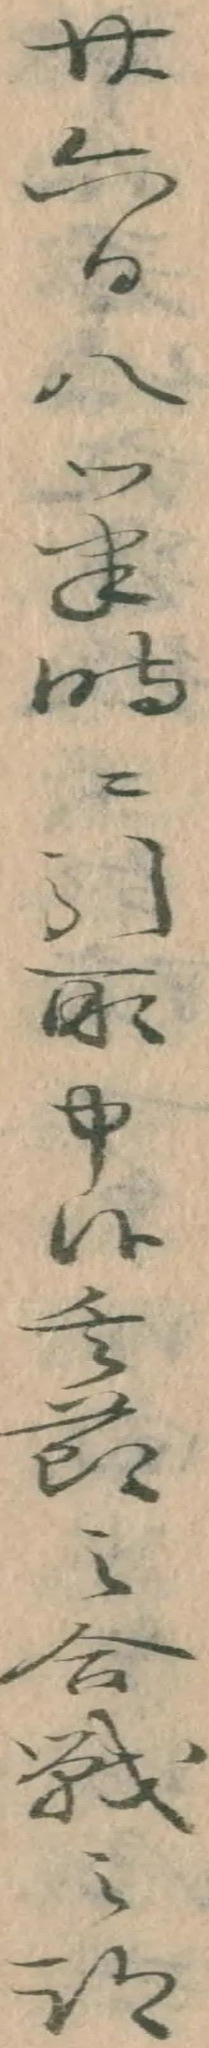廿六日八つ半時に引取申候其節之合戦之跡
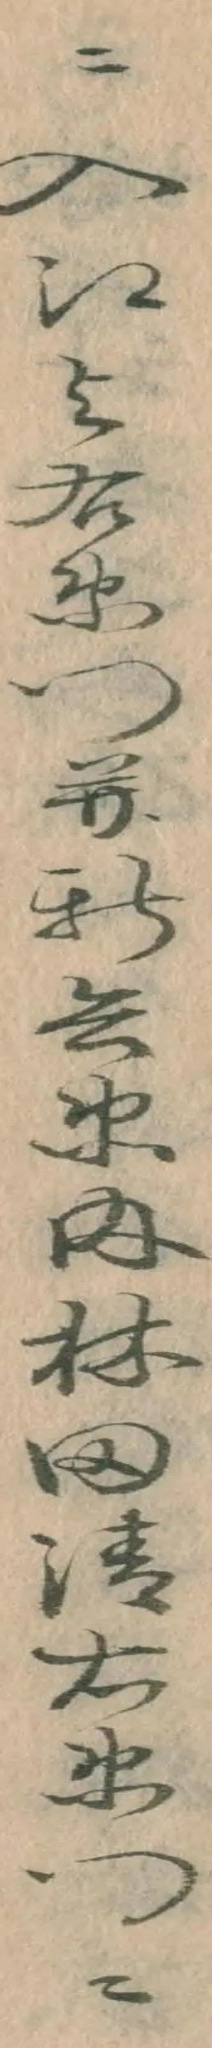に入江与右衛門并新兵衛内林田清右衛門に
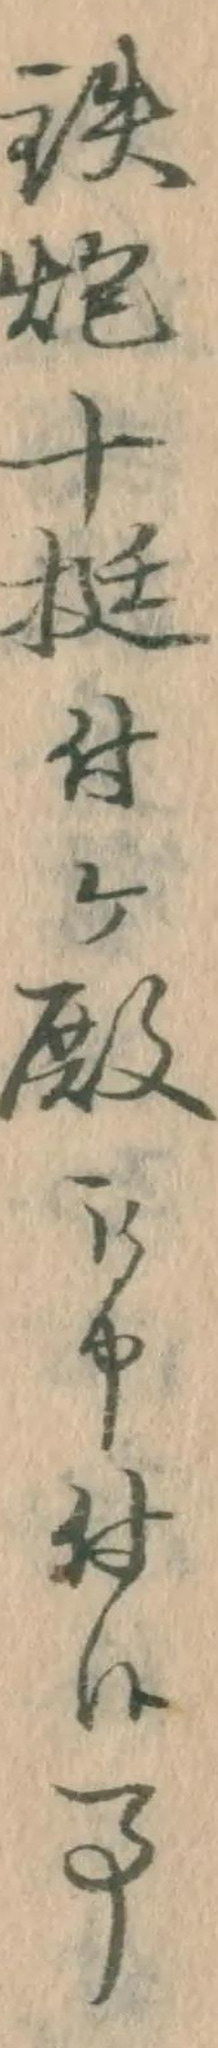鉄炮十挺付け殿被申付候事
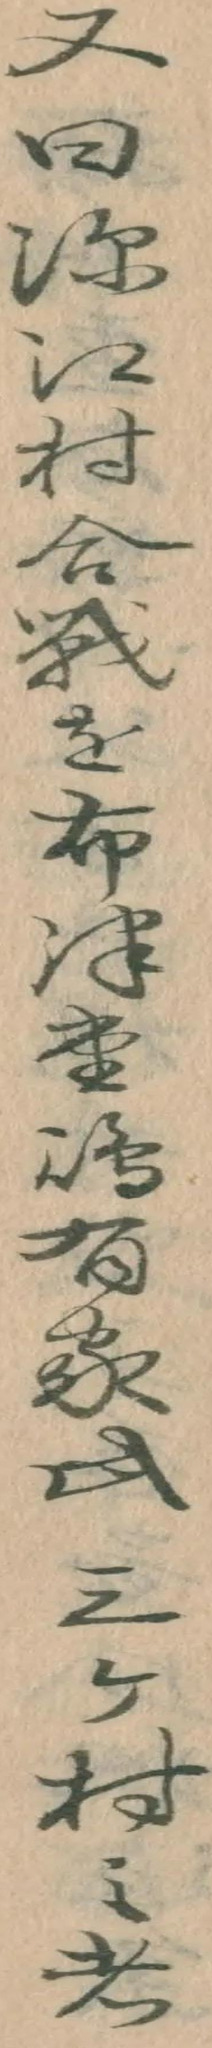又日深江村合戦を布津堂島有家此三か村之者
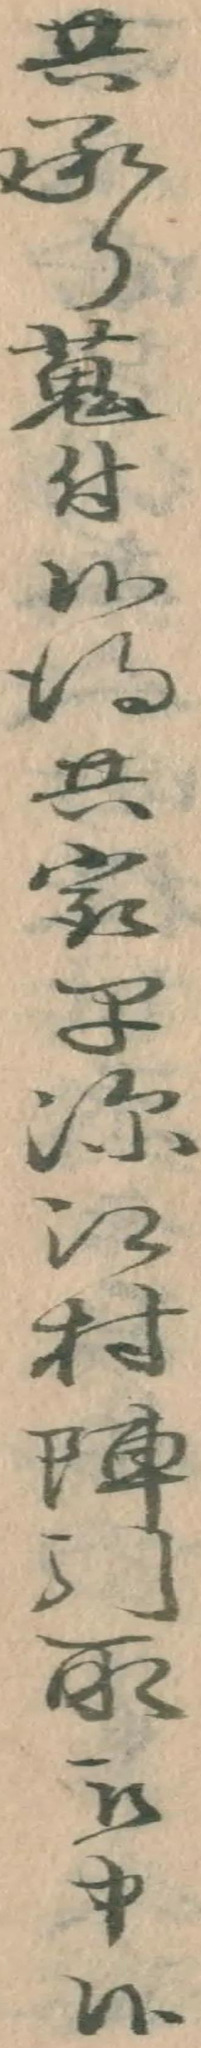共承り蒐付候得共最早深江村陣引取被申候
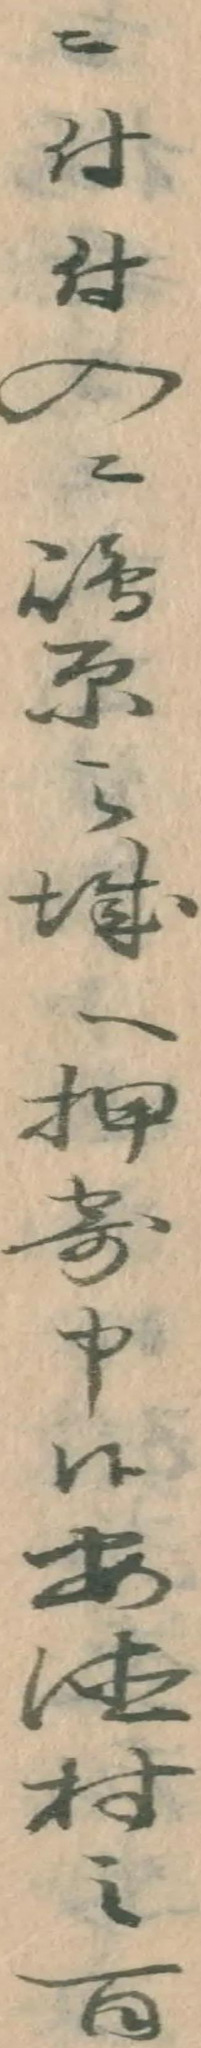に付付入に島原之城へ押寄申候安徳村之百
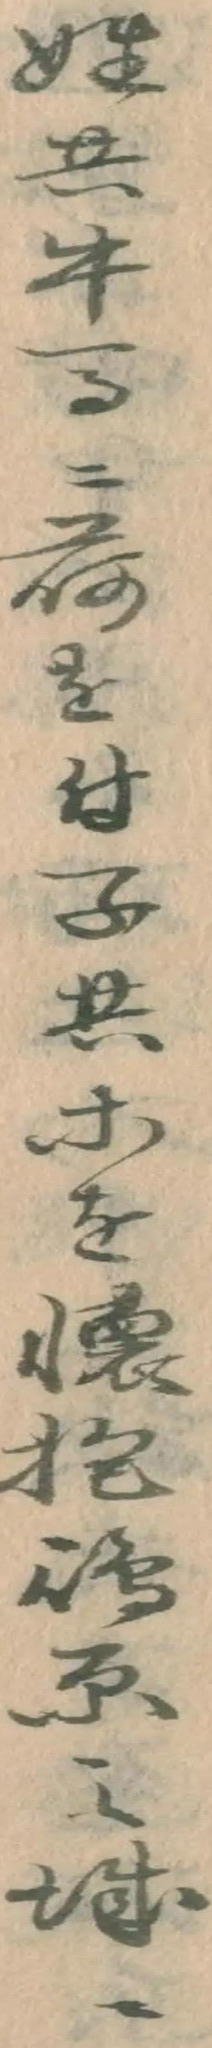姓共牛馬に荷を付子共等を懐抱島原之城に
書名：切支丹御退治記 49巻. [1]
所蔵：国立国会図書館 National Diet Library, JAPAN
